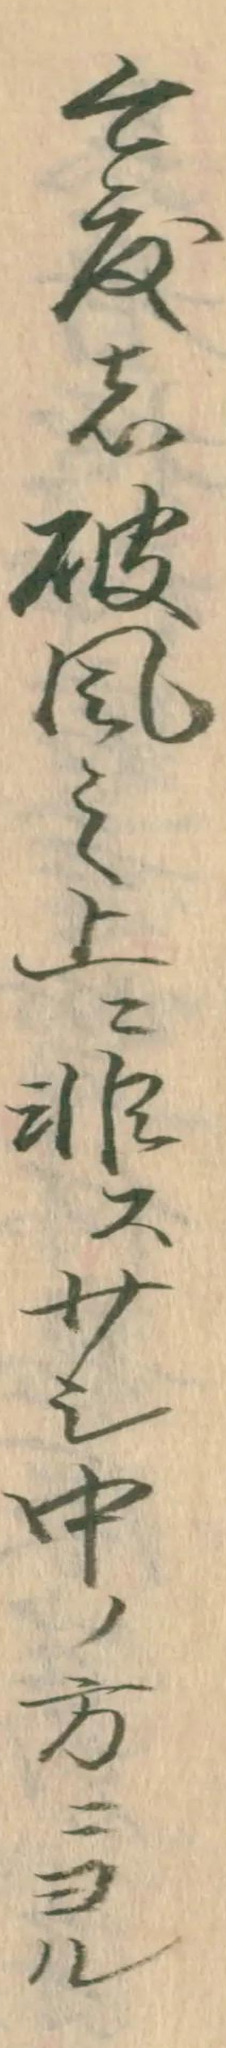今度者破風之上ニ非スサシ中ノ方ニヨル
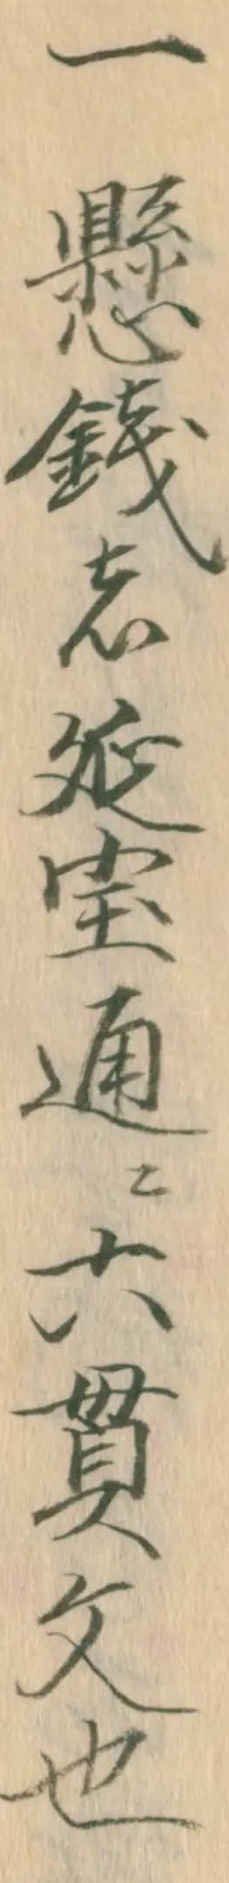一懸銭者延宝通ニ六貫文也

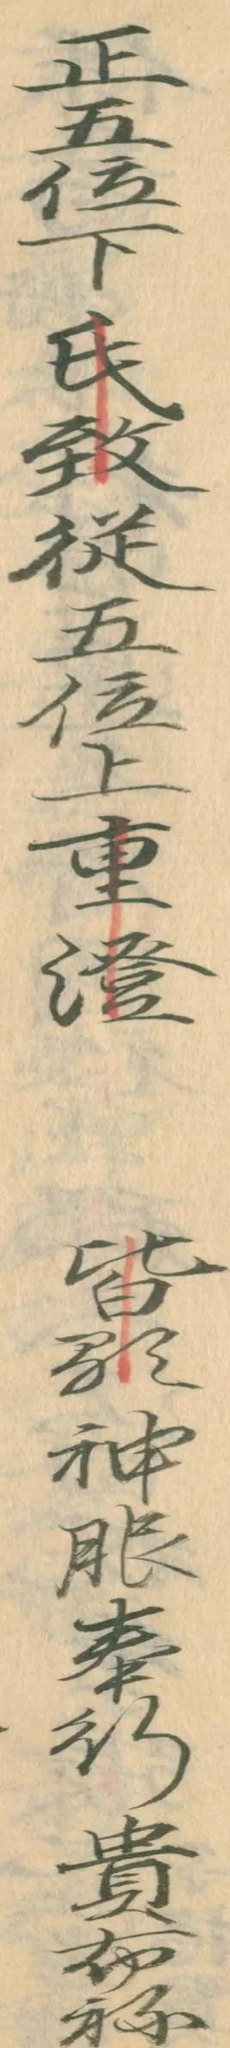正五位下氏致従五位上重澄皆顕神服奉行貴布祢
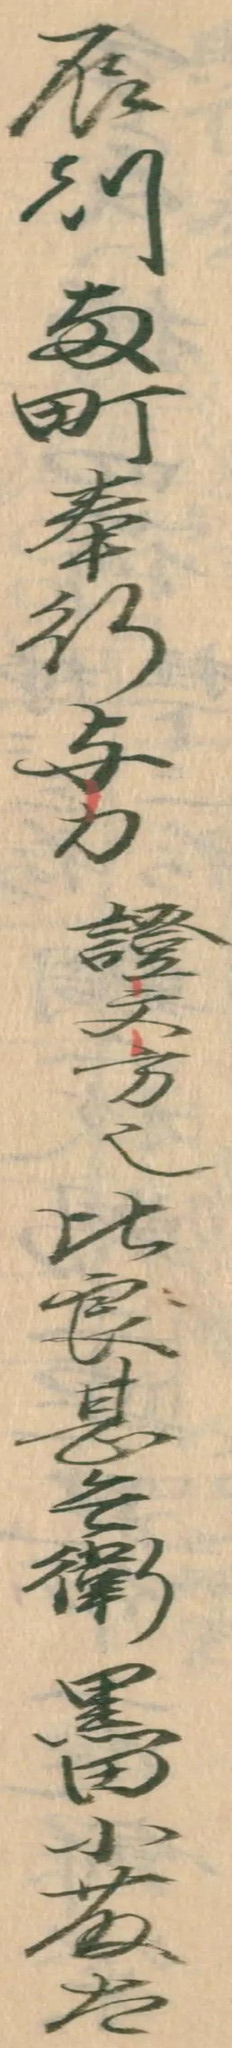辰刻両町奉行与-力証-文-方也比良甚兵衛黒田小藤太
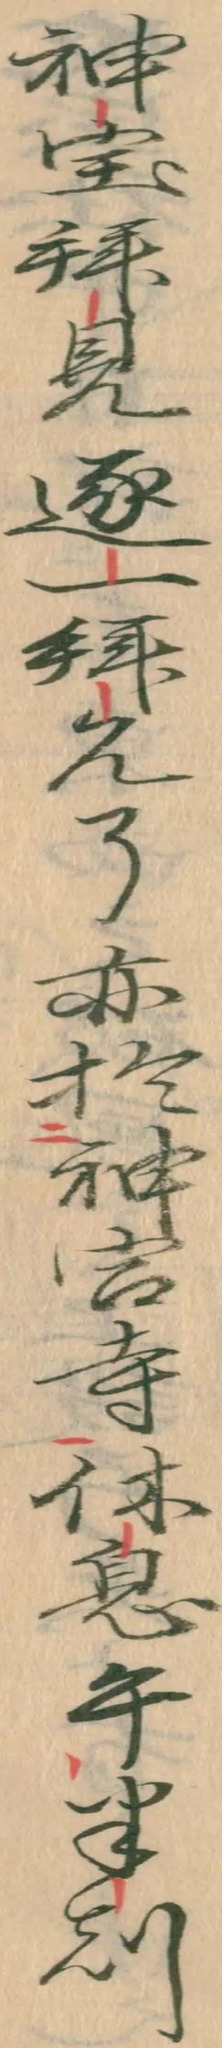神-宝拝-見逐-一拝-見了亦於神宮寺休-息午_半-刻
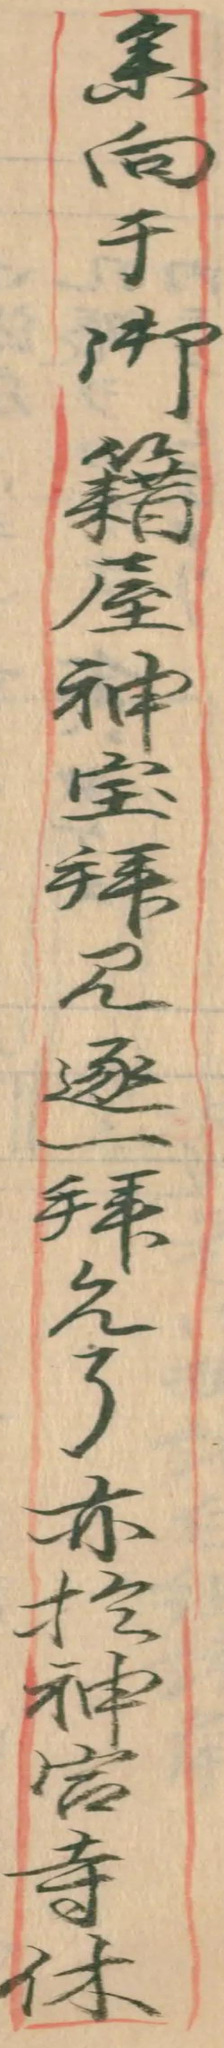参向于御籍屋神宝拝見逐一拝見了亦於神宮寺休
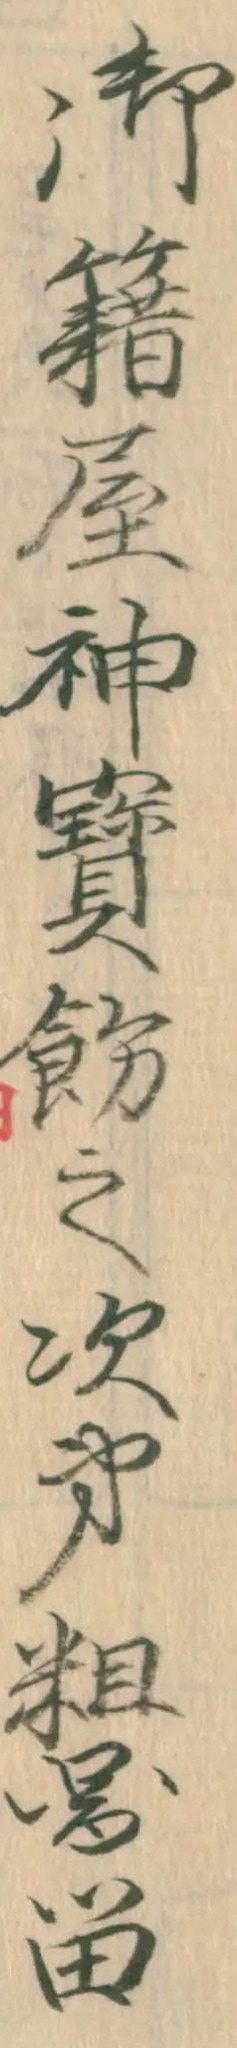御籍屋神宝錺之次第粗図留

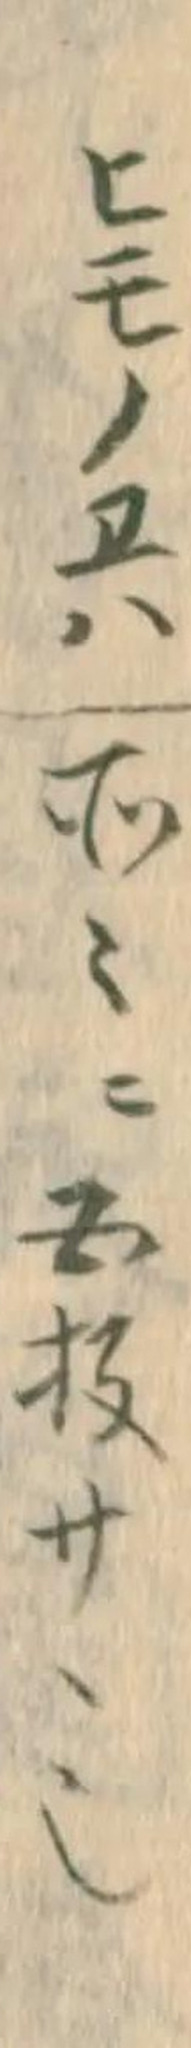ヒモノエハ所々ニ五枚サヽ也
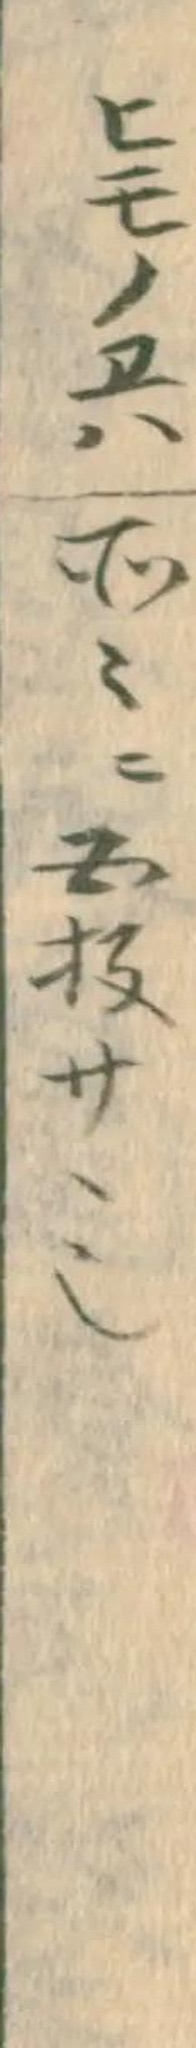ヒモノエハ所々ニ五枚サヽ也

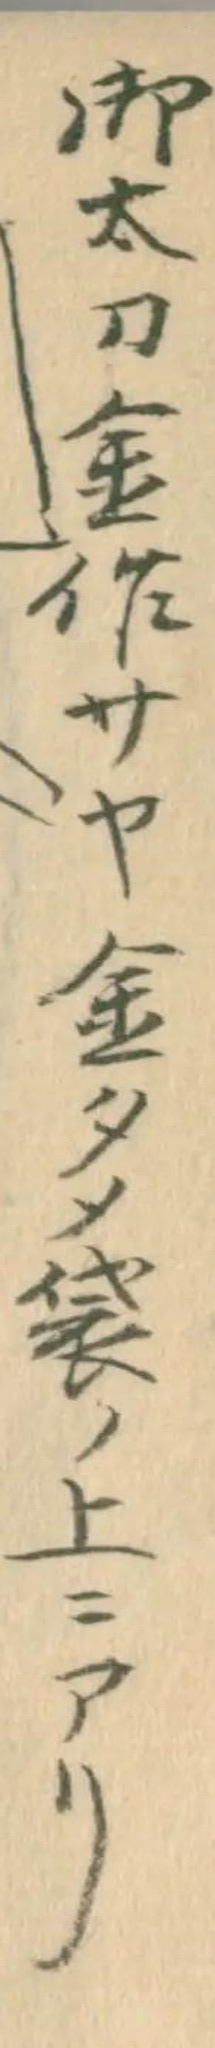御太刀金作サヤ金タメ袋ノ上ニアリ
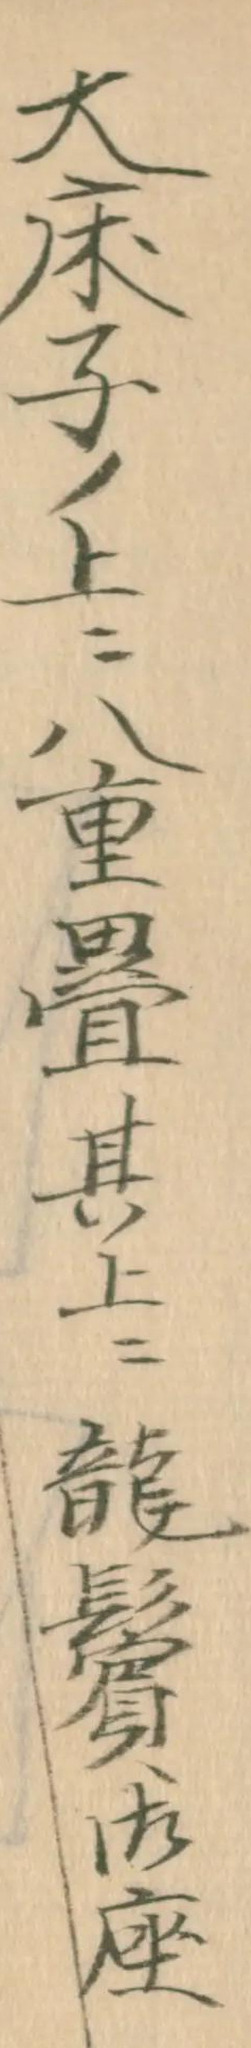大床子ノ上ニ八重畳其上ニ龍鬢御座
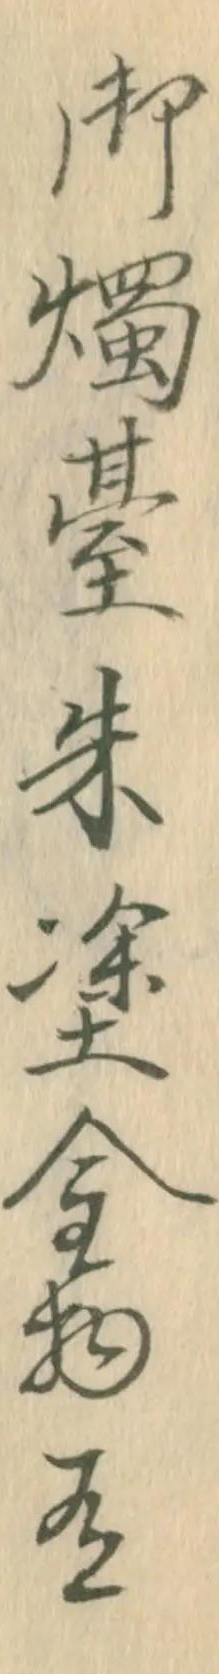御燭台朱塗金物有

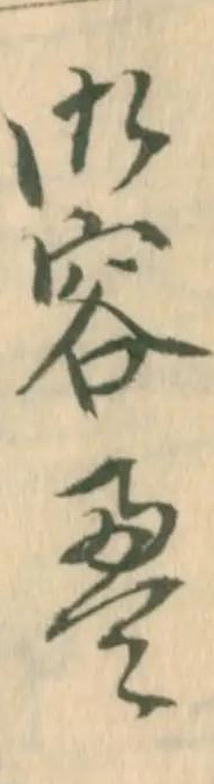御容畳
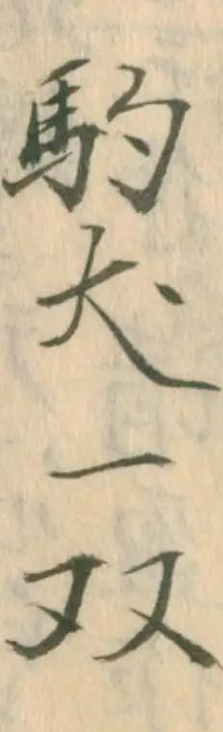駒犬一双
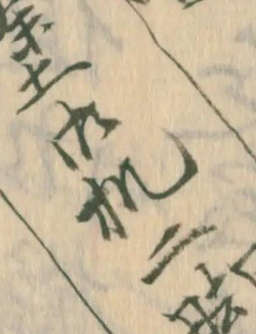塗御机二脚
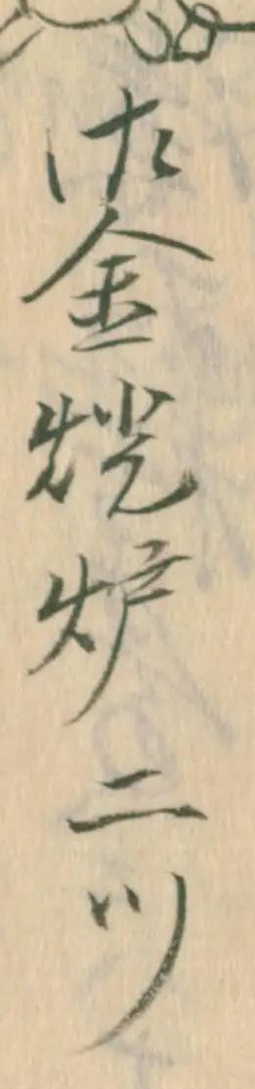御金焼炉二ツ
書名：賀茂社記録. 第15冊
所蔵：国立国会図書館 National Diet Library, JAPAN
